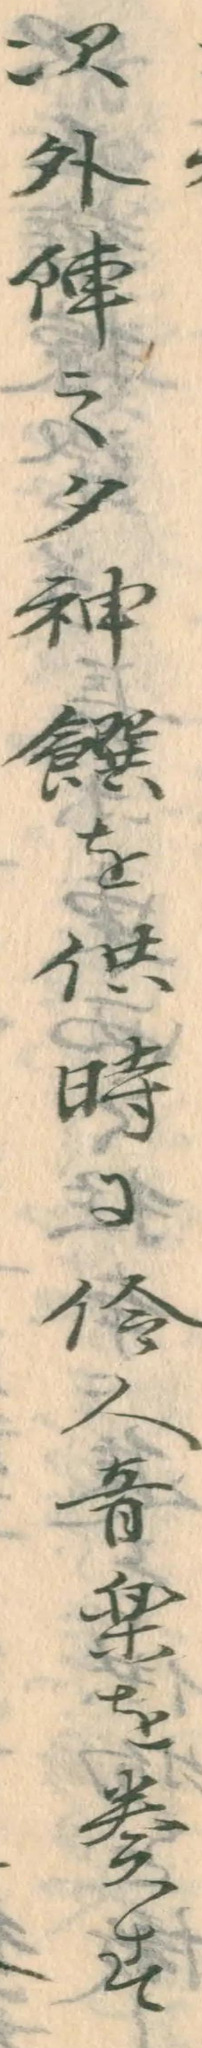次外陣之夕神饌を供時に伶人音楽を奏す
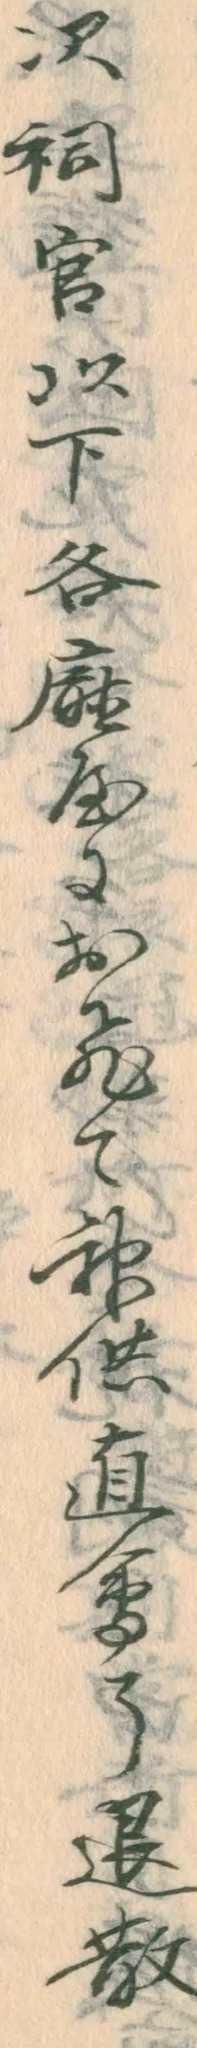次祠官以下各庁屋におひて神供直会了退散
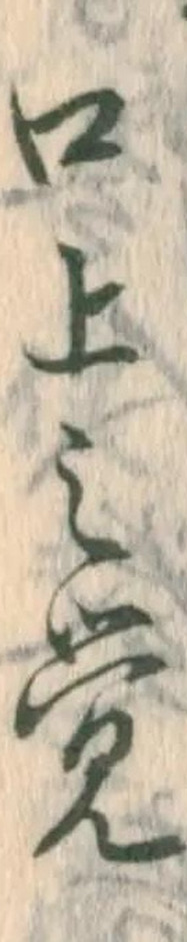口上之覚
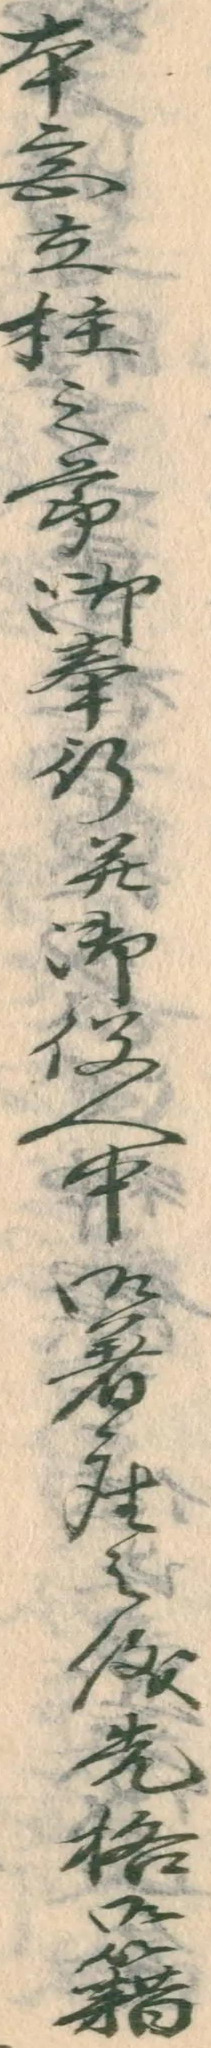本宮立柱之節御奉行并御役人中御着座之儀先格御藉
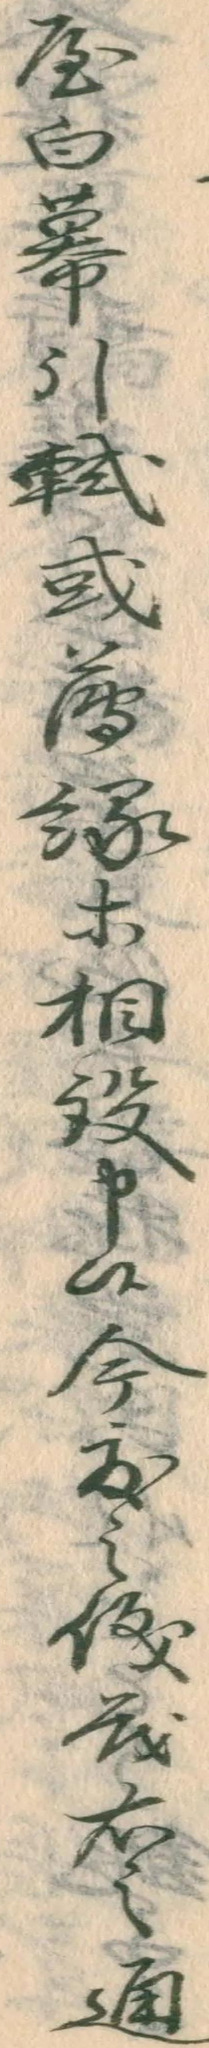屋白幕引軾或薄縁等相設申候今度之儀も右之通
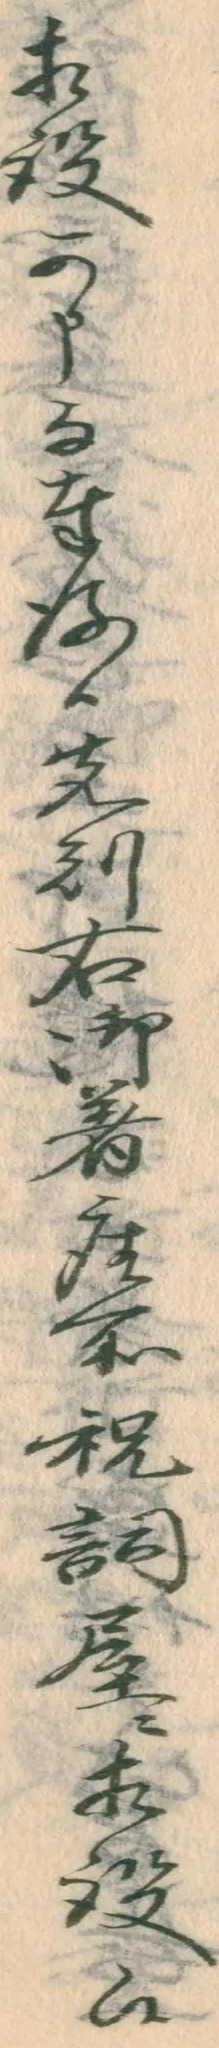相設可申与奉存候先刻右御着座所祝詞屋ニ相設候
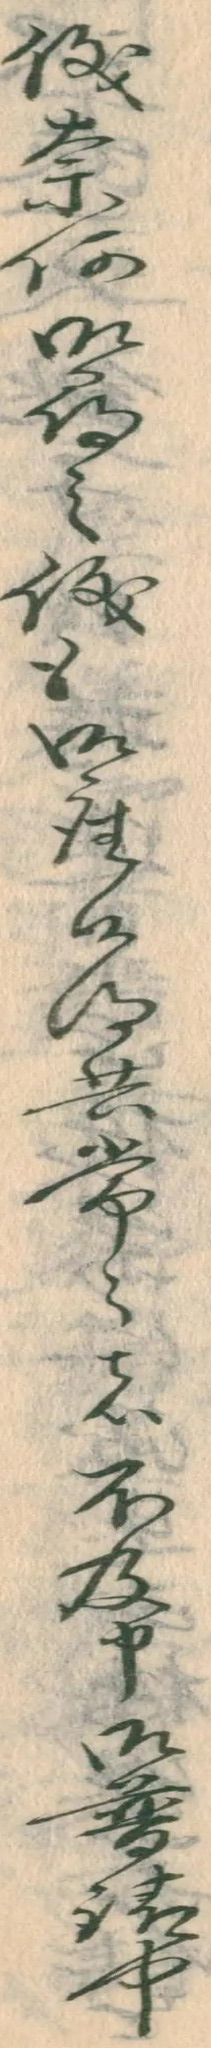儀奈何御尋之儀も御座候得共常々は不及申御普請中
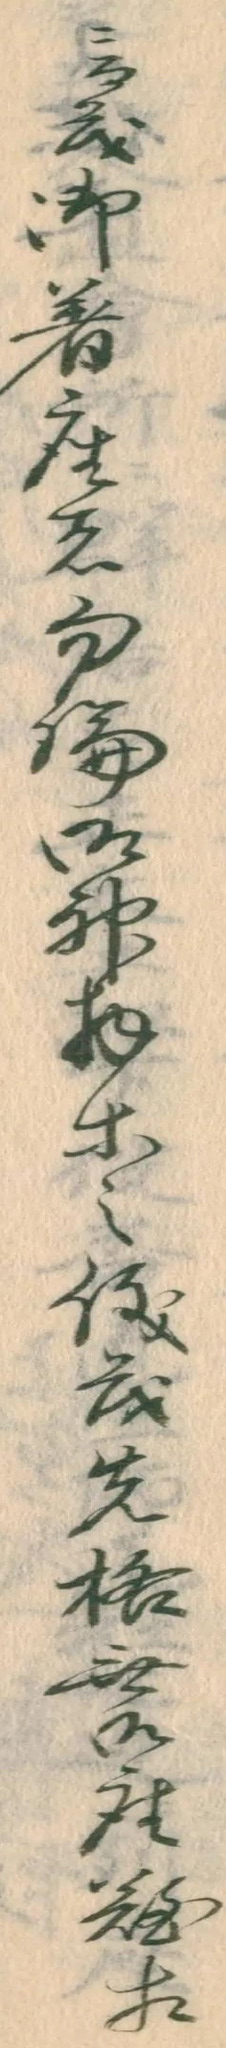ニ而も御着座は勿論御神拝等之儀も先格無御座難相
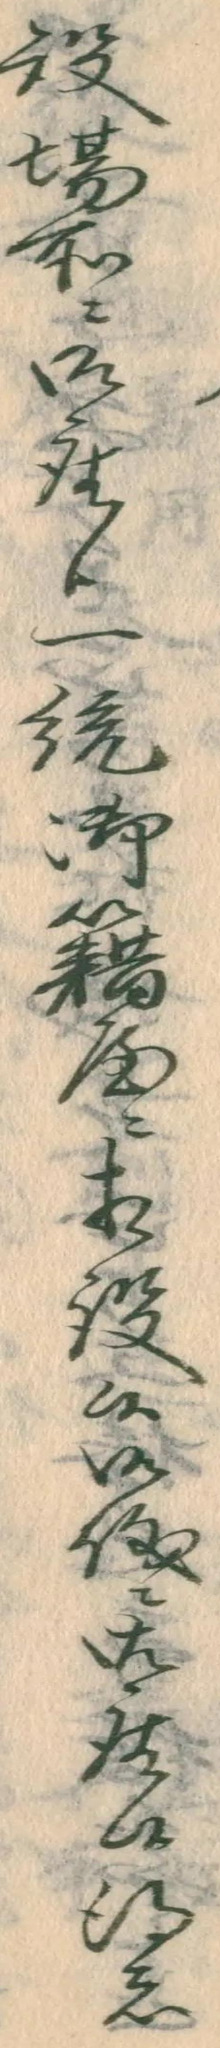設場所ニ御座候一統御藉屋ニ相設候御儀ニ御座候得は
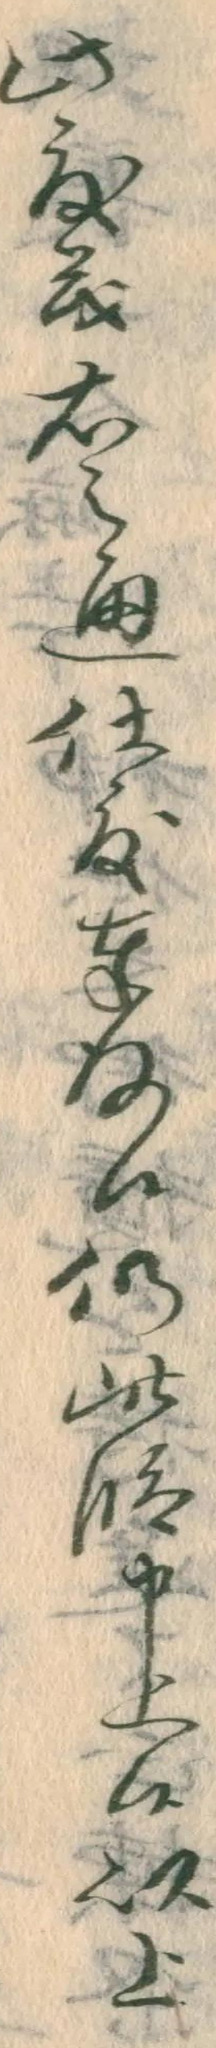此度も右之通仕度奉存候仍此段申上候以上
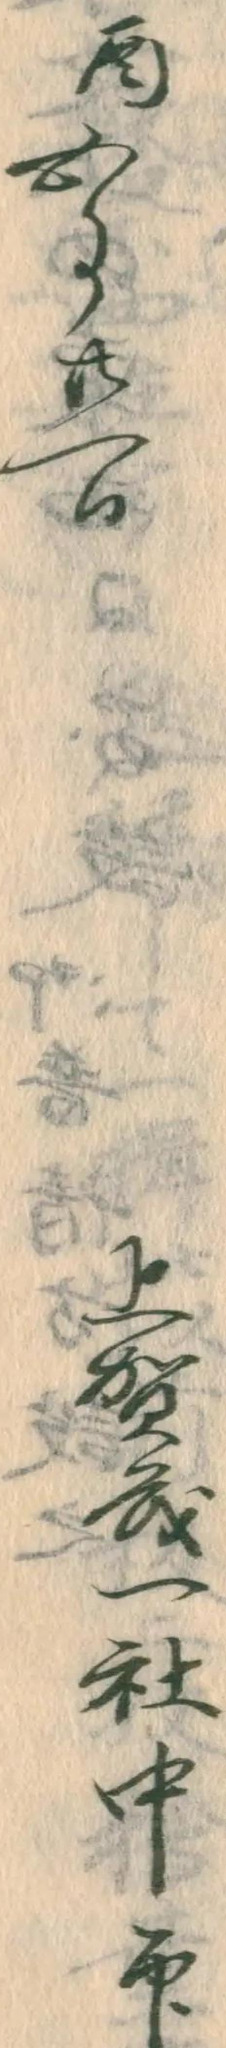酉五月廿一日上賀茂一社中印
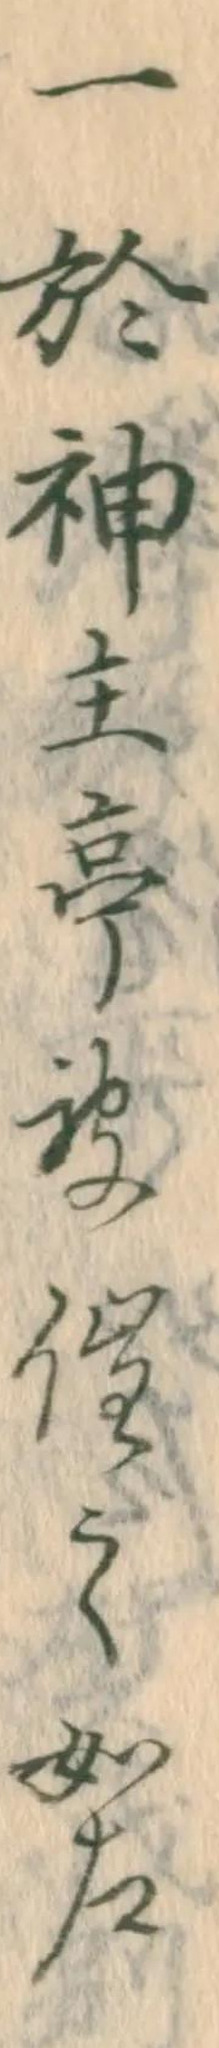一於神主亭被催之如左
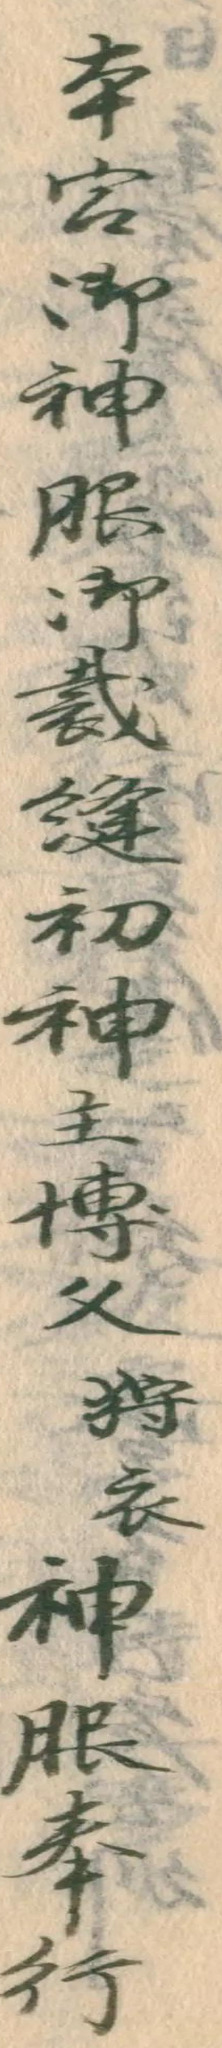本宮御神服御裁縫初神主博久狩衣神服奉行
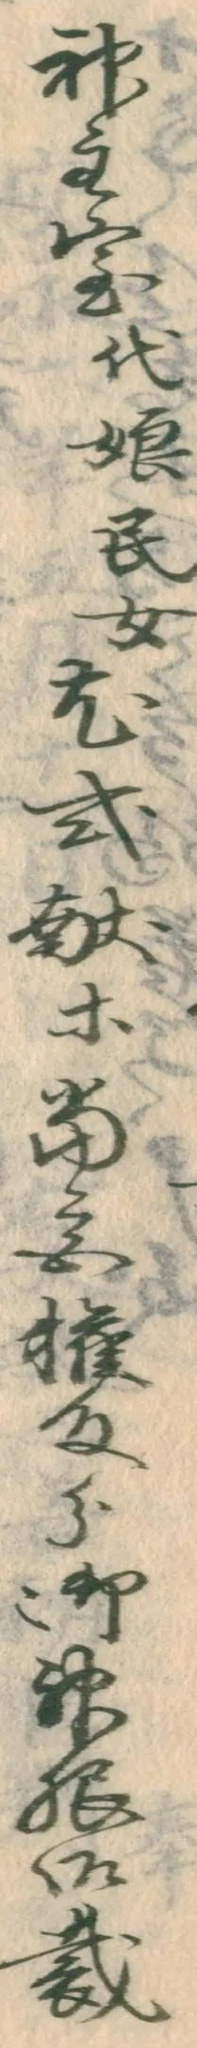神主室代娘民女尤式献等当宮権殿分御神服御裁
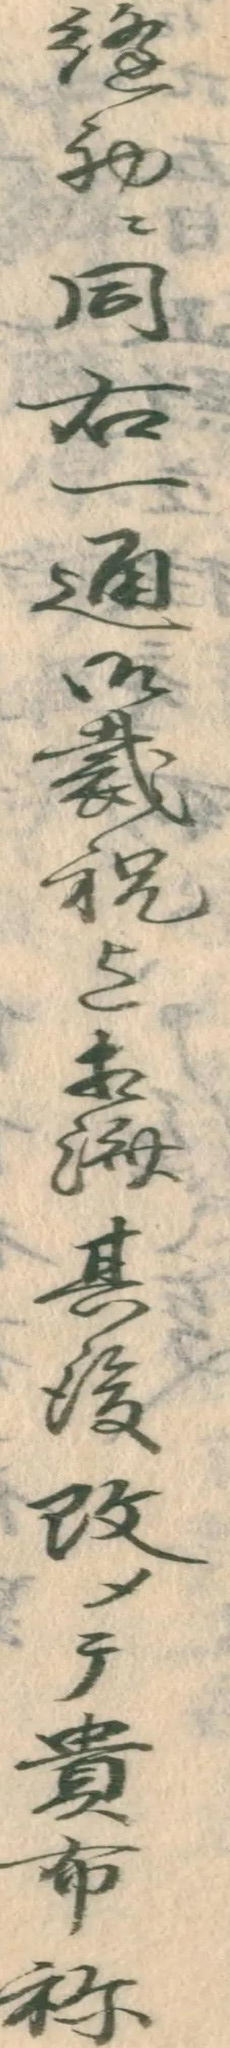縫初ニ同右一通御裁祝迄相済其後改メテ貴布祢
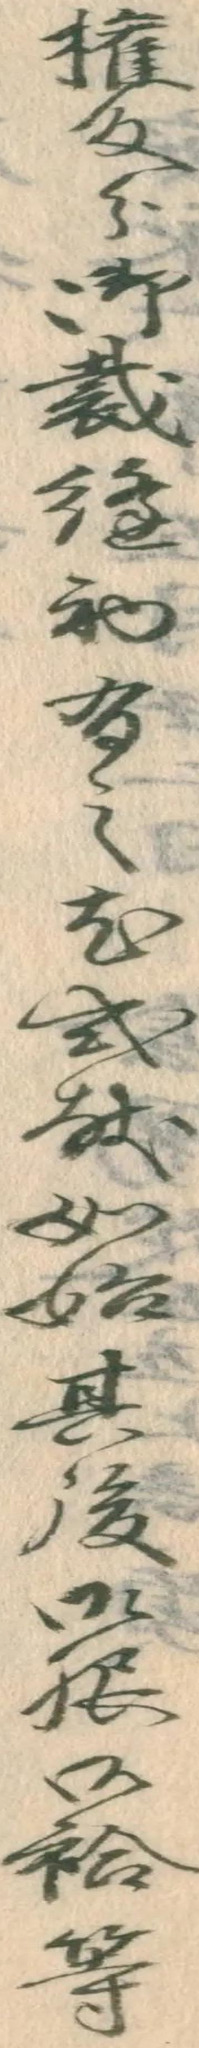権殿分御裁縫初有之尤式献如始其後御服御袷等
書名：賀茂社記録. 第17冊
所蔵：国立国会図書館 National Diet Library, JAPAN
